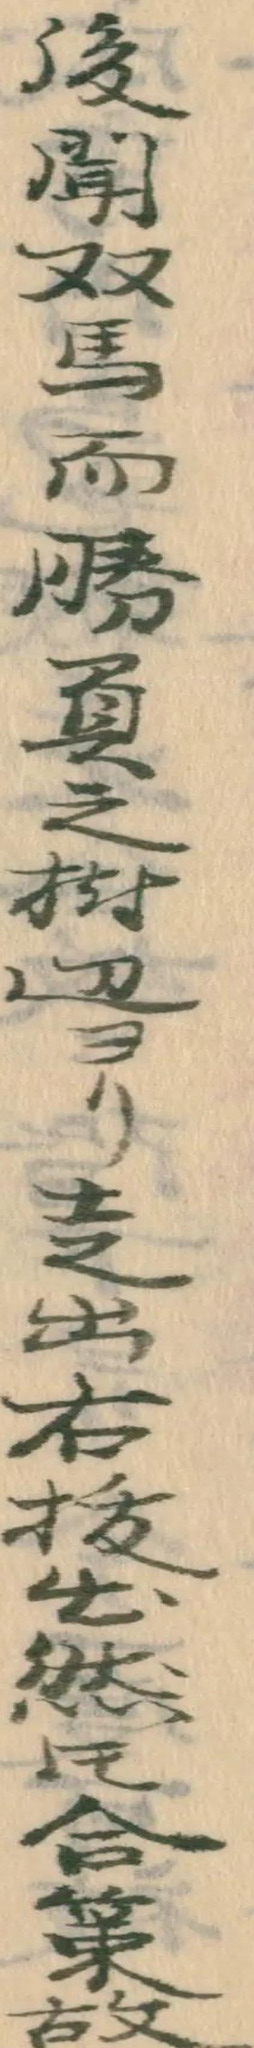後聞双馬而勝負之樹辺ヨリ走出右抜出然トモ合策故
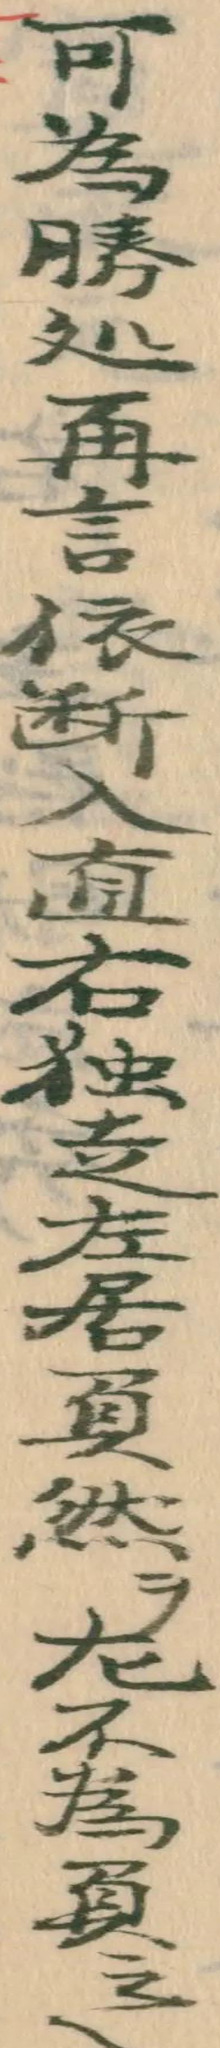可為勝処再言依断入直右独走左居負然ヲ左不為負云々
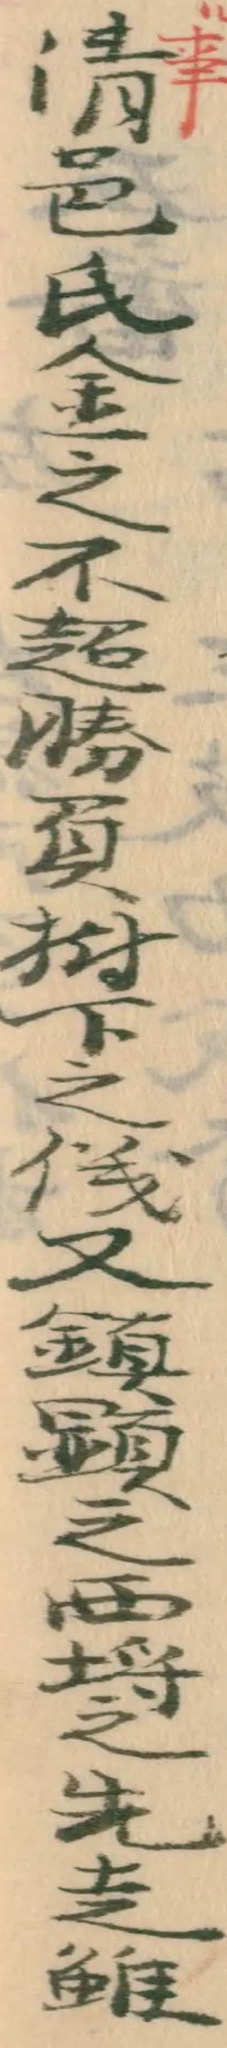清邑氏金不超勝負樹下之儀又鎮顕之西埒之先走雖
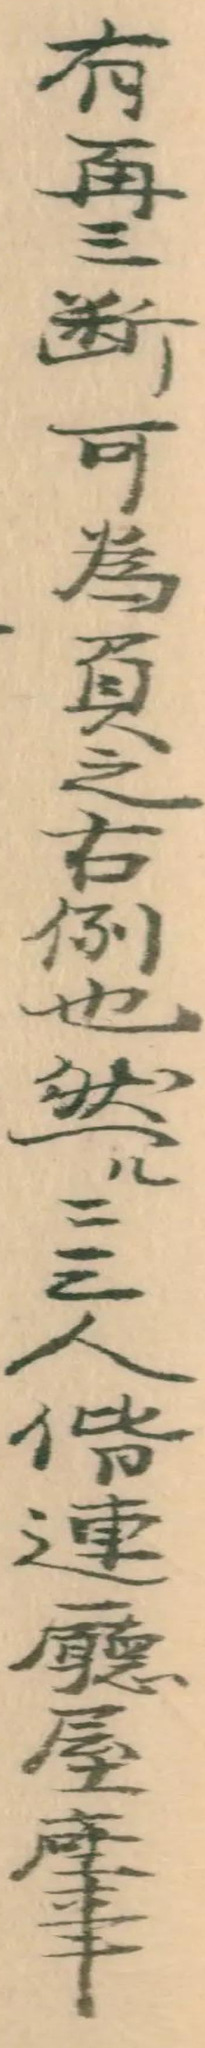有再三断可為負之古例也然ルニ三人偕連庁屋座事
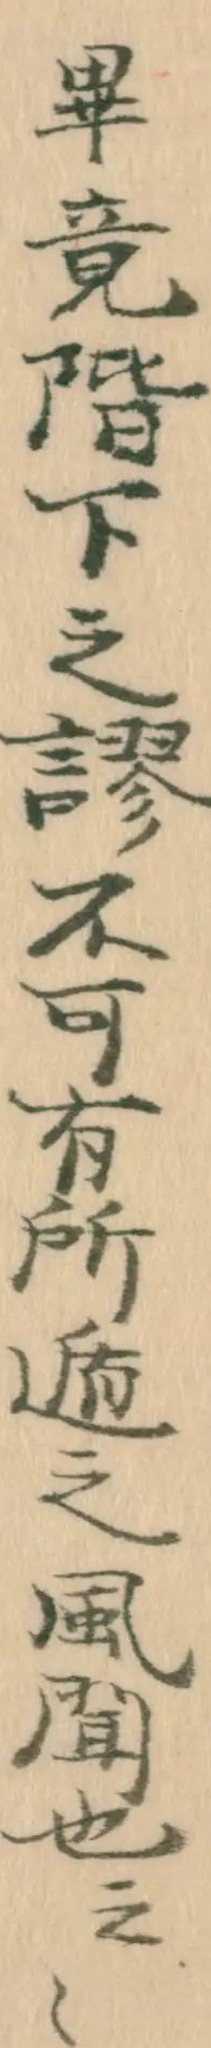畢竟階下之謬不可有所遁之風聞也云々
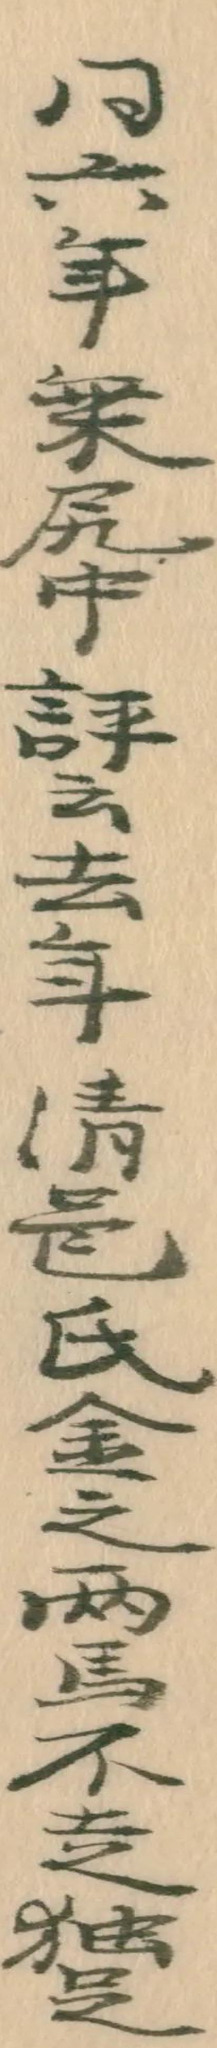一同六年乗尻中評云去年清邑氏金之両馬不走独走
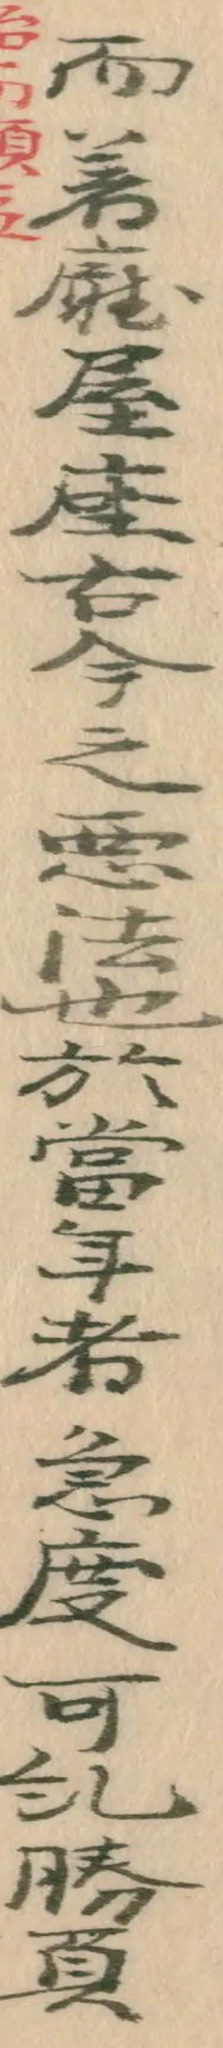而着庁屋座古今之悪法也於当年者急度可糺勝負
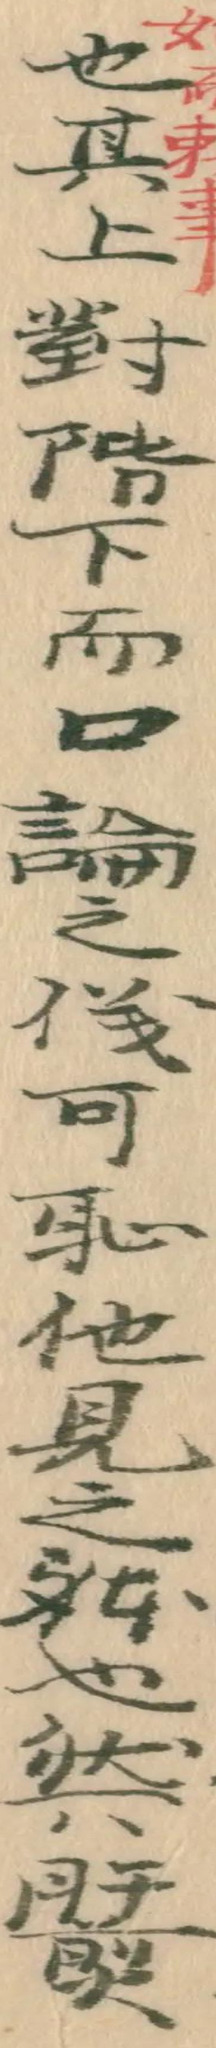也其上対階下而口論之儀可恥他見之体也然ハ肝煎
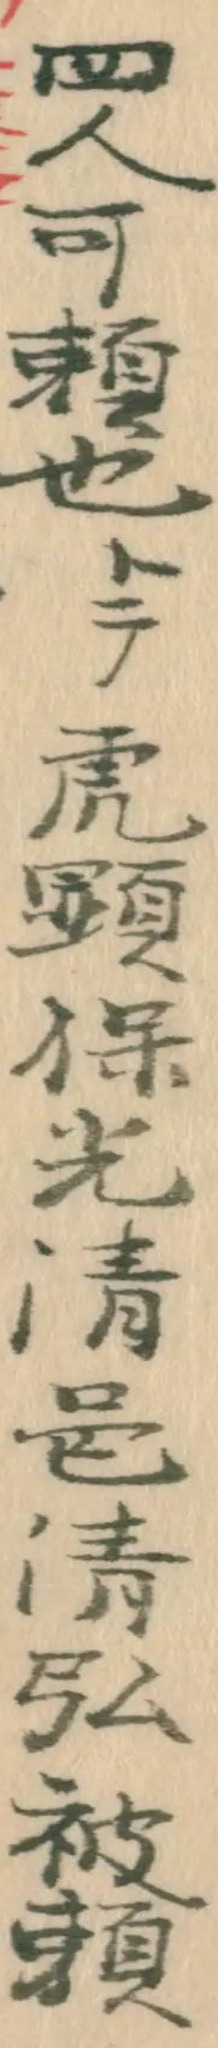四人可頼也トテ虎顕保光清邑清弘被頼
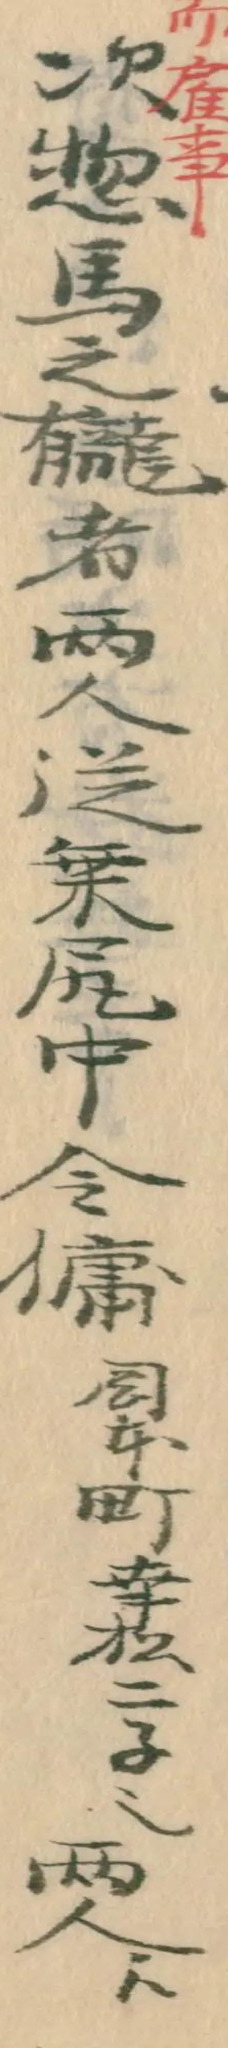次惣馬之龓者両人従乗尻中令傭岡本町幸松二子也両人江
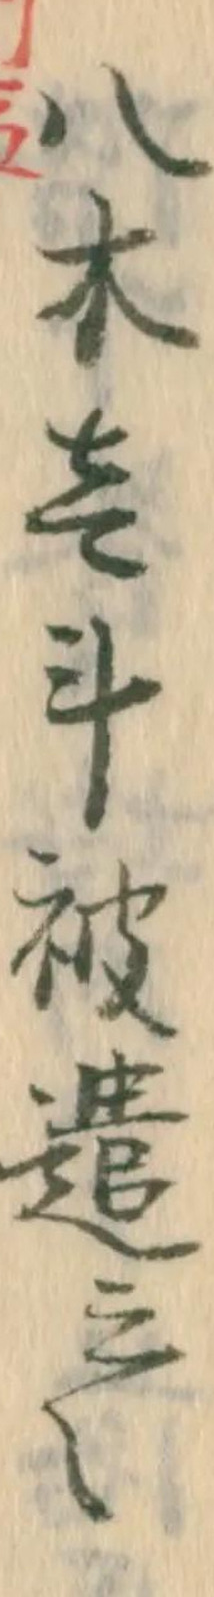八木壱斗被遣云々
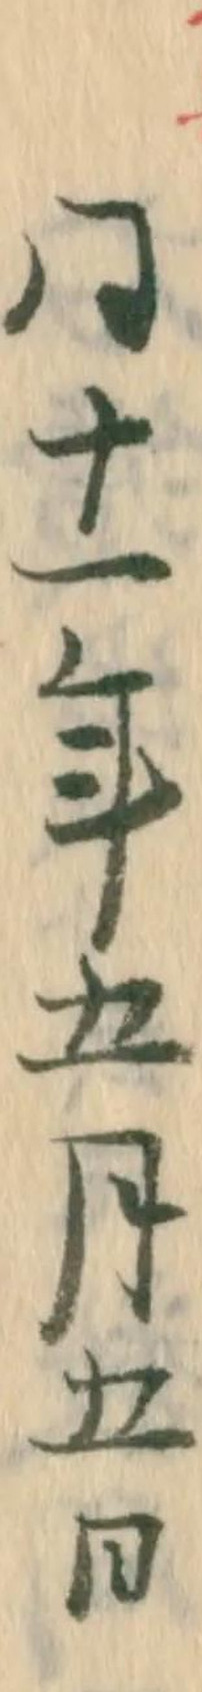一同十一年五月五日
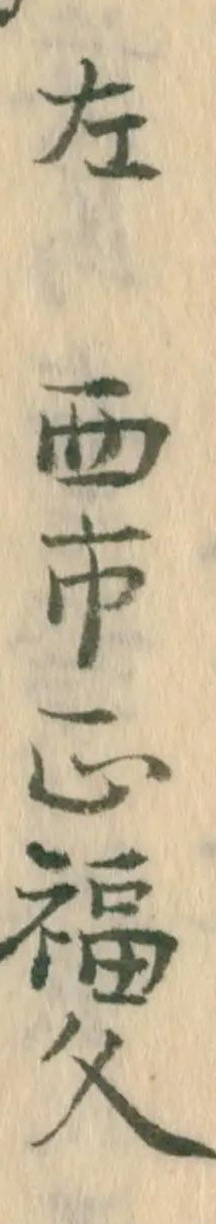左西市正福久

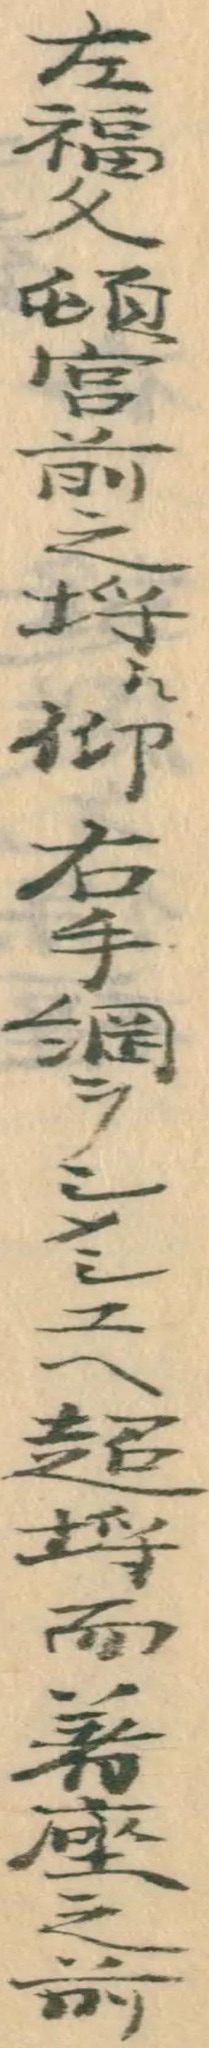左福久頓宮前之埒江仰右手綱ヲシメシユヘ超埒而着座之前
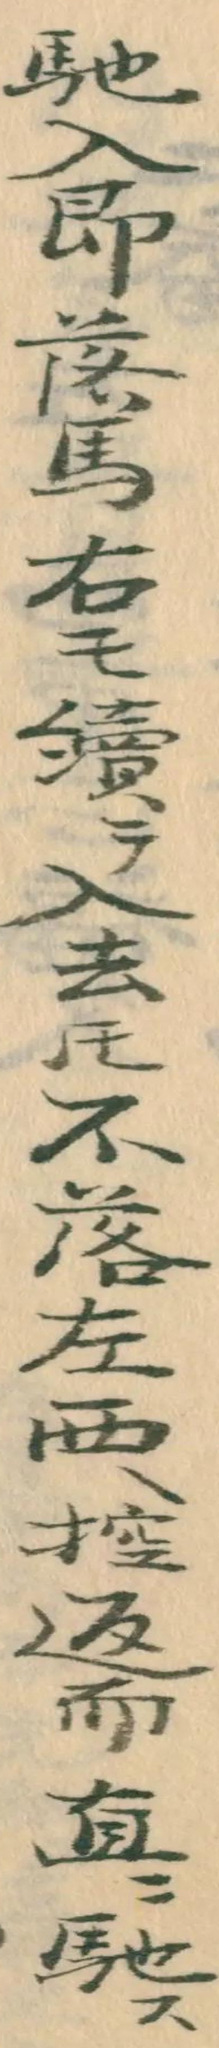馳入即落馬右モ続テ入去トモ不落左西へ控返而直ニ馳ス
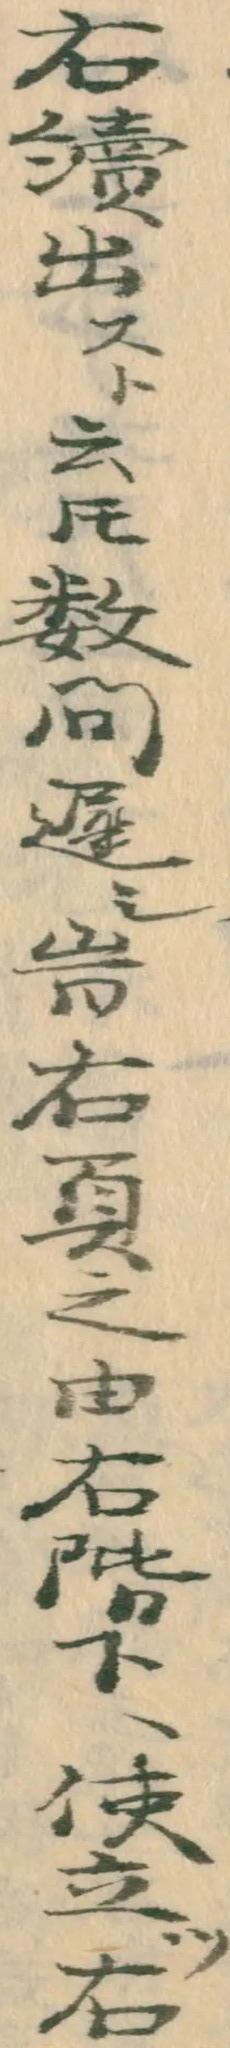右続出スト云トモ数間遅シ時右負之由右階下へ使立ツ右
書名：賀茂社記録. 第12冊
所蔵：国立国会図書館 National Diet Library, JAPAN
